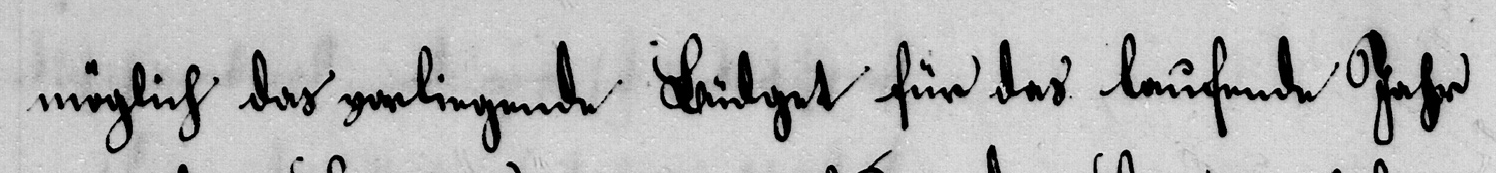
möglich das vorliegende Budget für das laufende Jahr
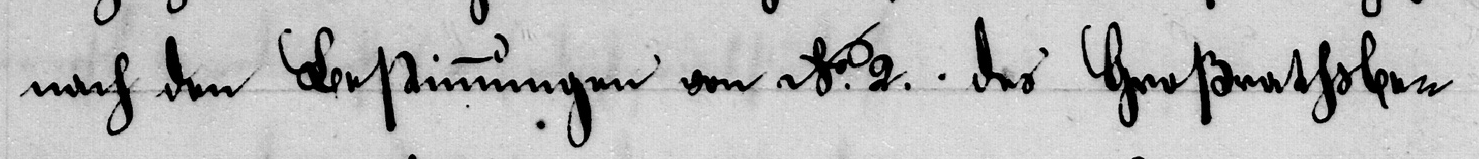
nach den Bestimmungen von No. 2. des Großrathsbe¬
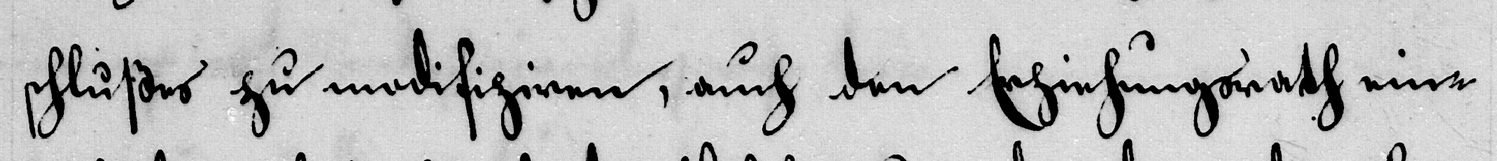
schlußes zu modifiziren, auch den Erziehungsrath ein¬
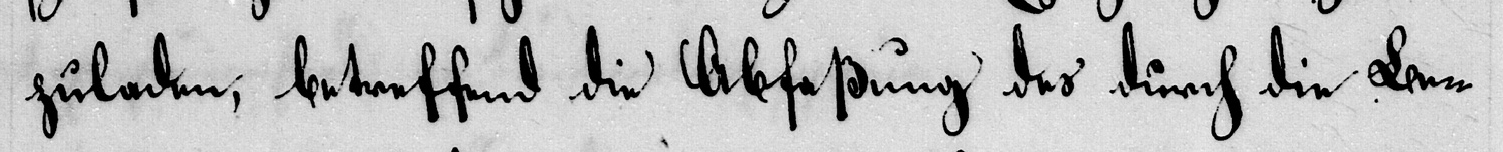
zuladen, betreffend die Abfaßung des durch die Be¬
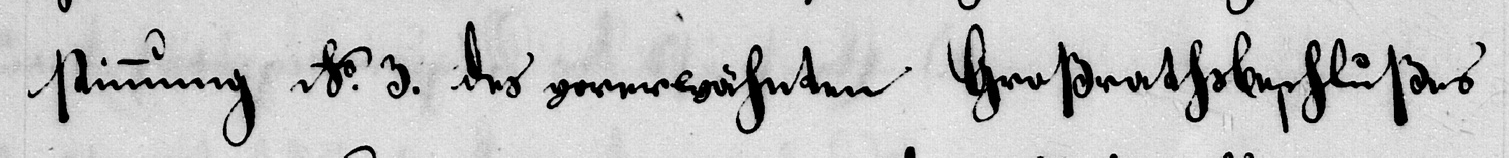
stimmung No. 3. des vorerwähnten Großrathsbeschlußes
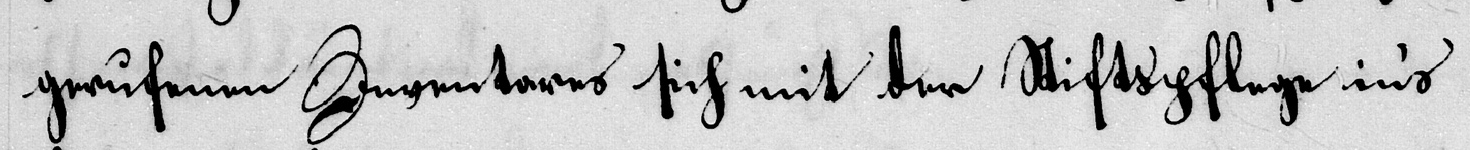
gerufenen Inventares sich mit der Stiftspflege ins
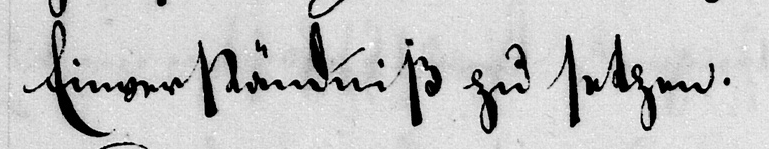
Einverständiß zu setzen.
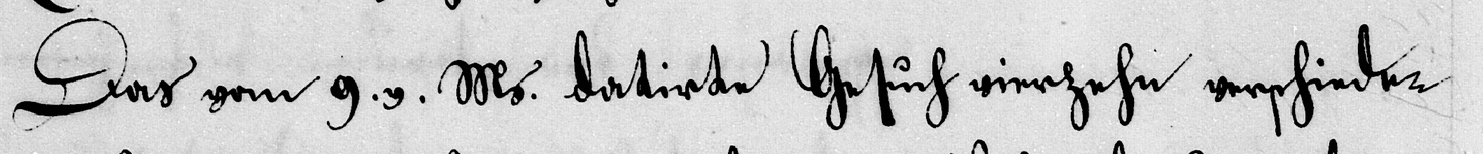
Das vom 9. v. Ms. datirte Gesuch vierzehn verschiede¬
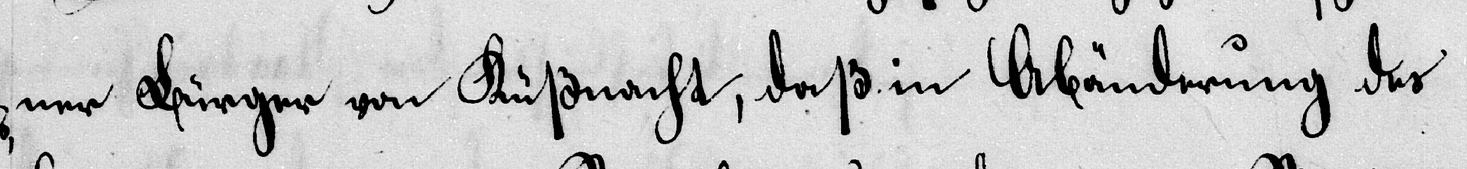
ner Bürger von Küßnacht, daß in Abänderung des
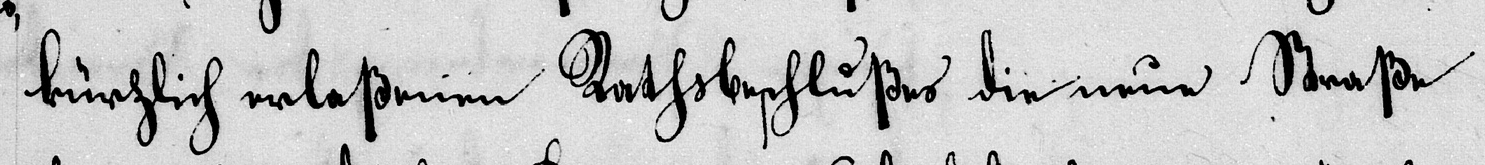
kürzlich erlaßenen Rathsbeschlußes die neue Straße
